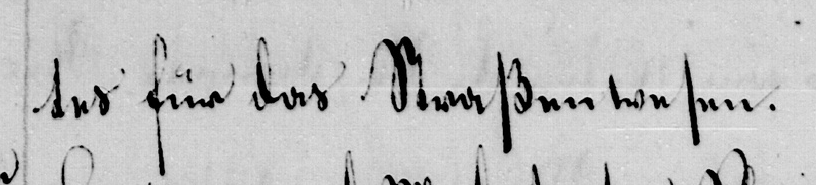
tes für das Straßenwesen.
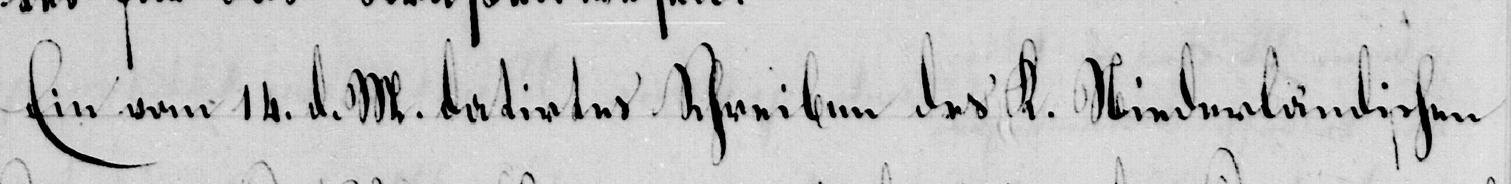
Ein vom 14. d. M. datirtes Schreiben des K. Niederländischen
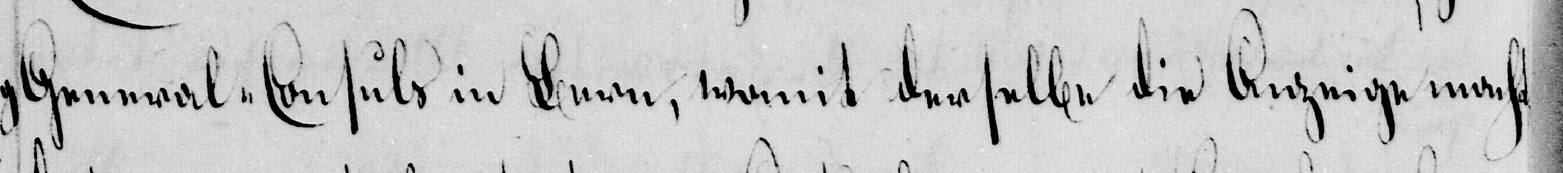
General-Consuls in Bern, womit derselbe die Anzeige macht,
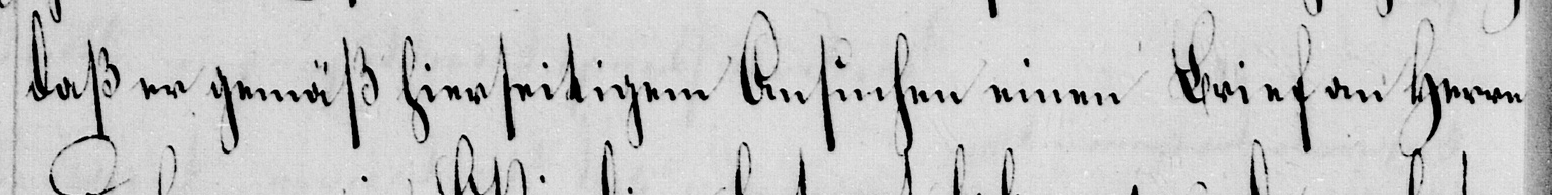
daß er gemäß hierseitigem Ansuchen einen Brief an Herrn
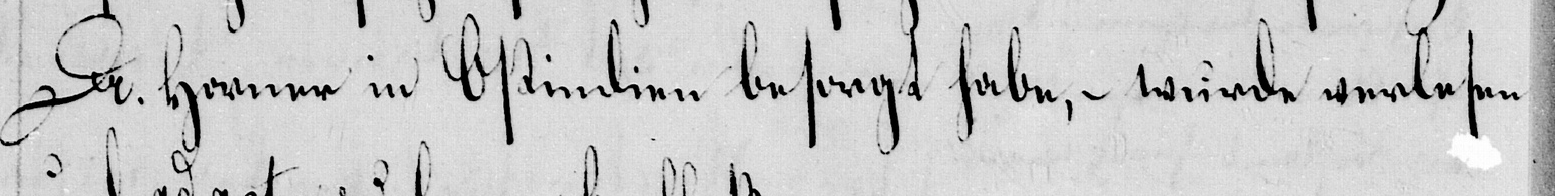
Dr. Horner in Ostindien besorgt habe, – wurde verlesen
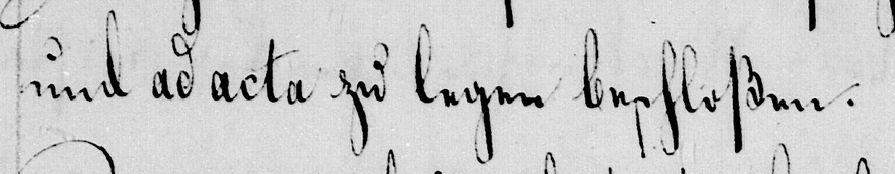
und ad acta zu legen beschloßen.
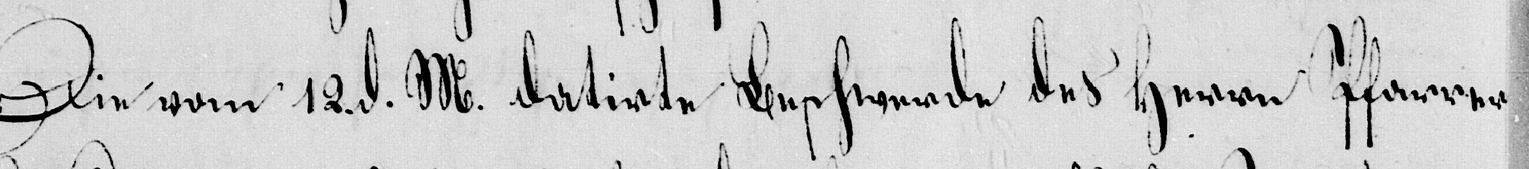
Die vom 12. d. M. datirte Beschwerde des Herrn Pfarrer
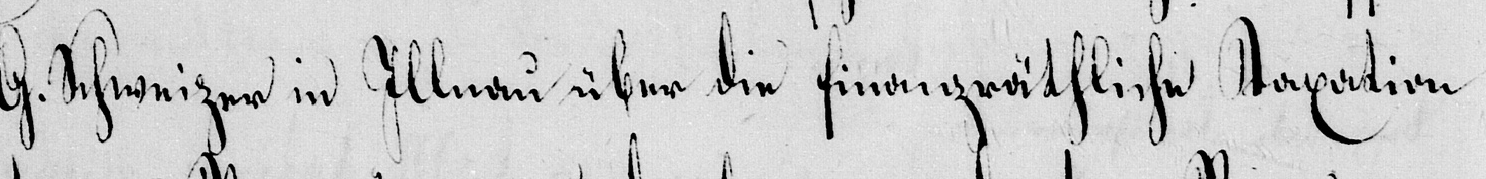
G. Schweizer in Illnau über die finanzräthliche Taxation
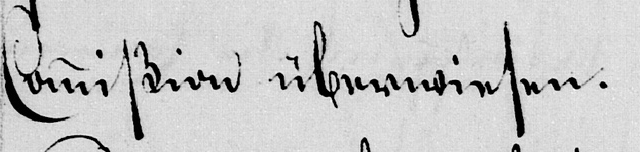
ommißion überwiesen.
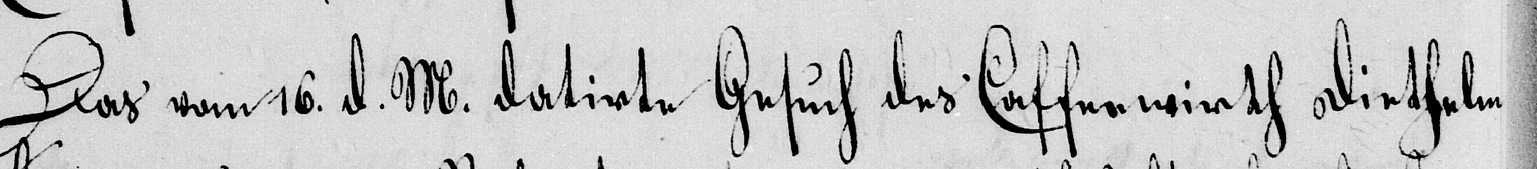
Das vom 16. d. M. datirte Gesuch des Cafeewirth Diethelm
